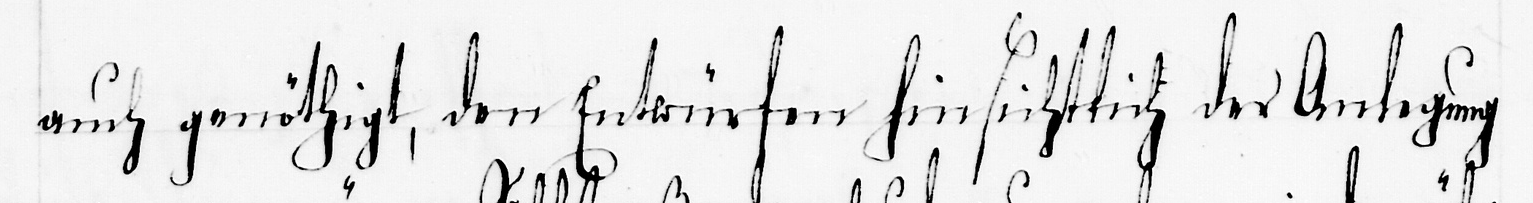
auch genöthigt, den Entwürfen hinsichtlich der Anlegung
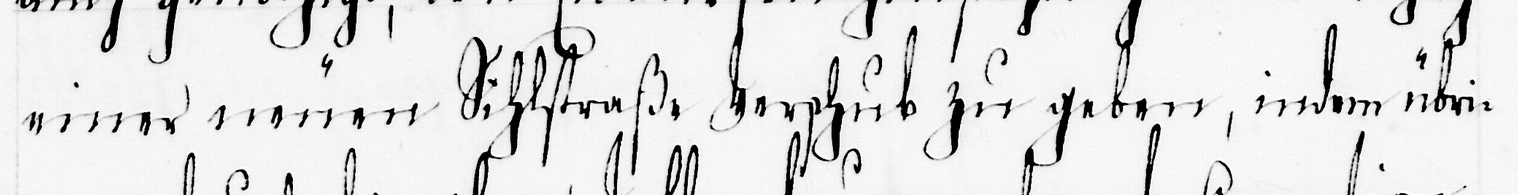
einer neuen Sihlstraße Vorschub zu geben, indem übri¬
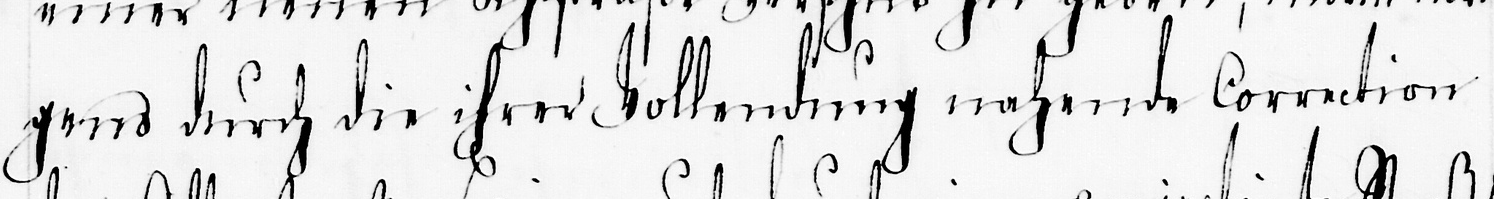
gens durch die ihrer Vollendung nahende Correction
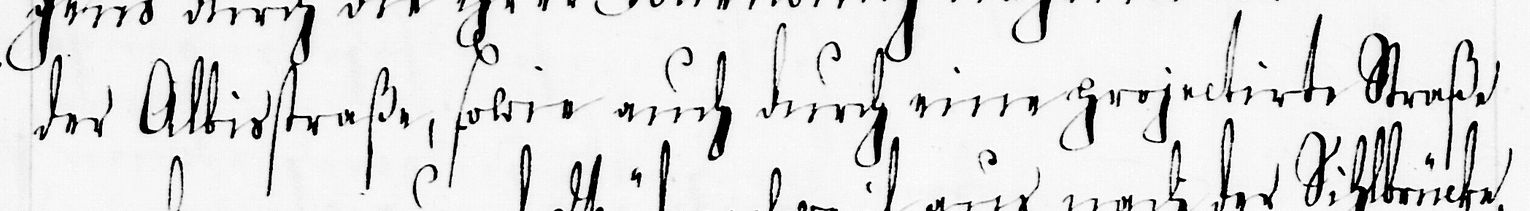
der Albisstraße, sowie auch durch eine projectirte Straße
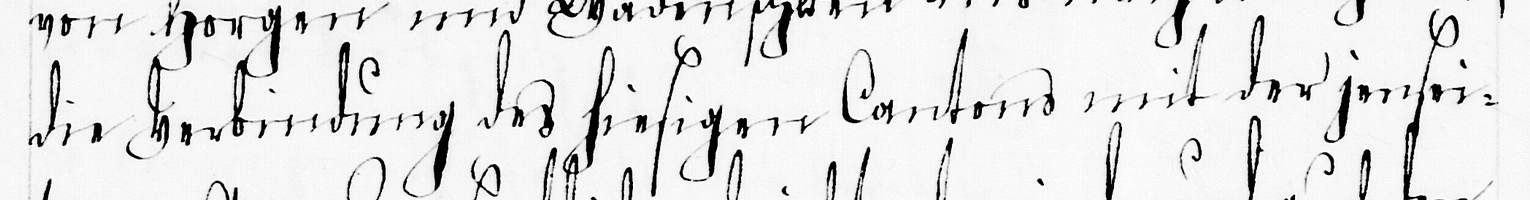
die Verbindung des hiesigen Cantons mit der jensei¬
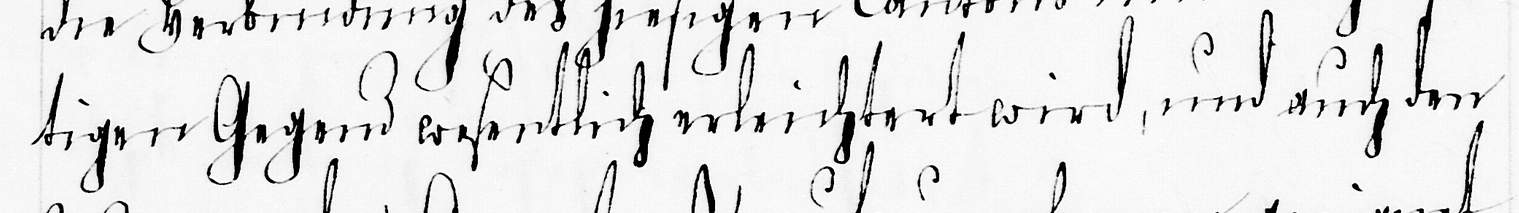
tigen Gegend wesentlich erleichtert wird, und auch den
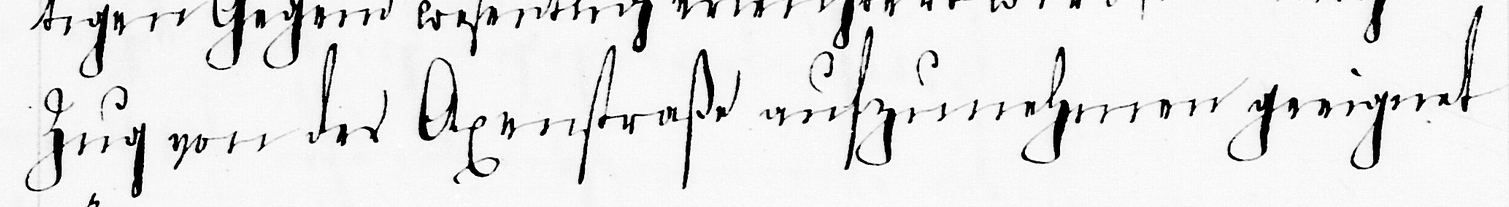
Zug von der Axenstraße aufzunehmen geeignet
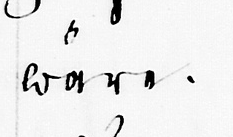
wäre.
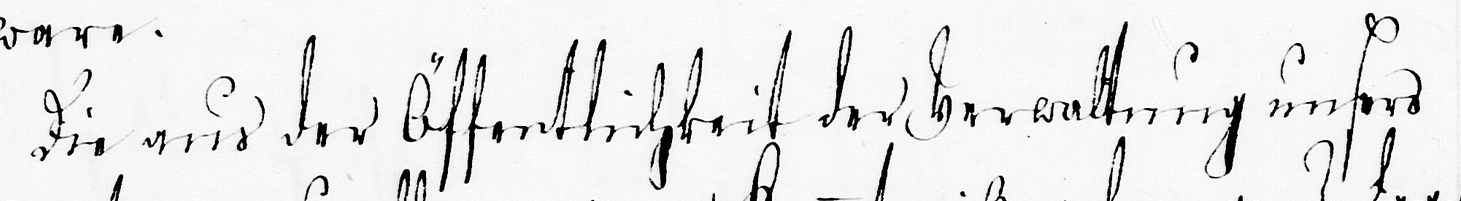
Die aus der Öffentlichkeit der Verwaltung unsers
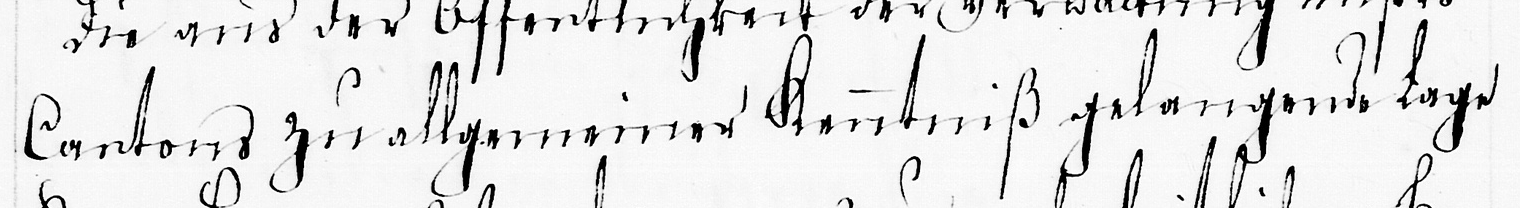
Cantons zu allgemeiner Kenntniß gelangende Lage
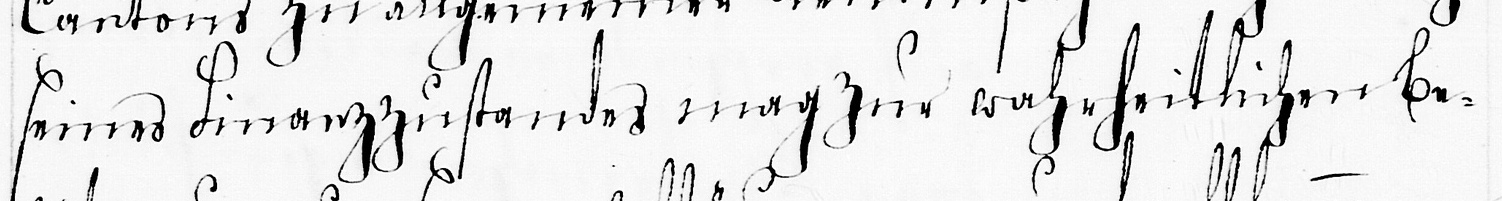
seines Finanzzustandes mag zur wahrheitlichen Be¬
